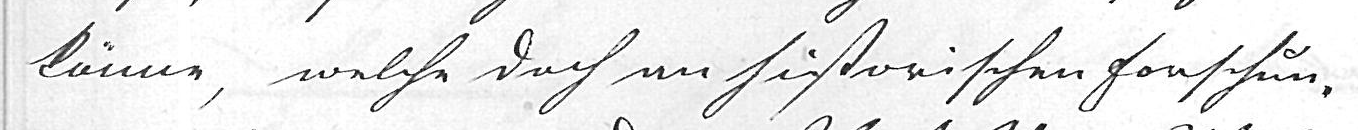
könne, welche doch an historischen Forschun-
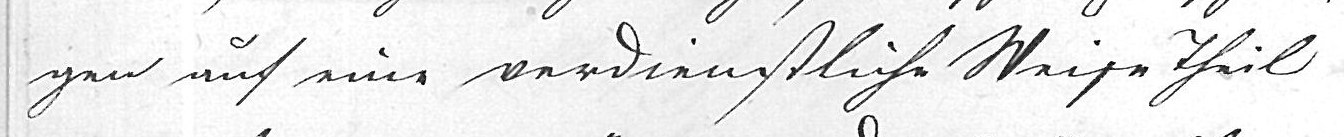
gen auf eine verdienstliche Weise Theil
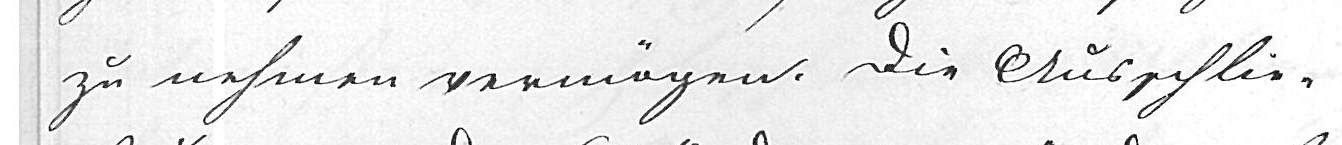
zu nehmen vermögen. Die Ausschlie-
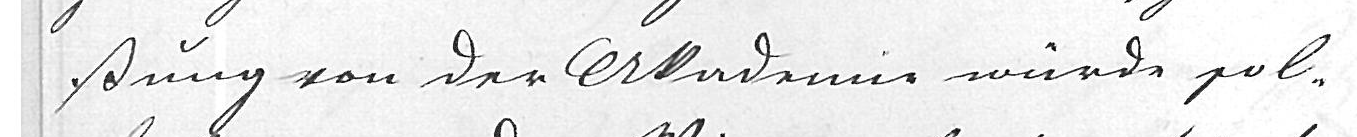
ßung von der Akademie wurde sol-
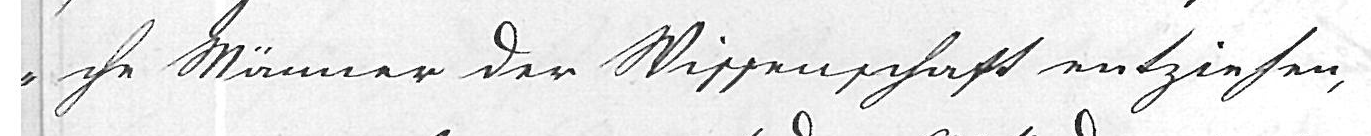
che Männer der Wissenschaft entziehen,
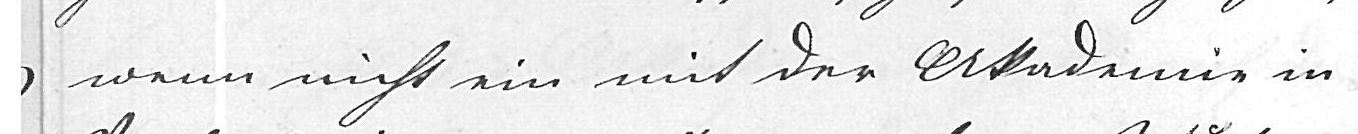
wenn nicht ein mit der Akademie in
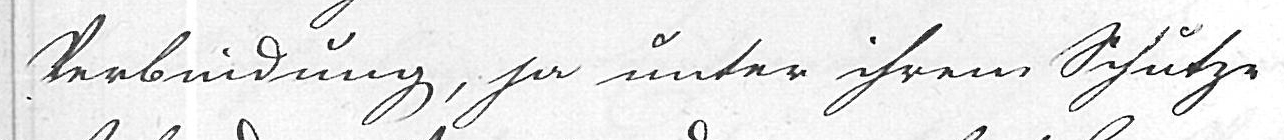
Verwendung, ja unter ihrem Schutze
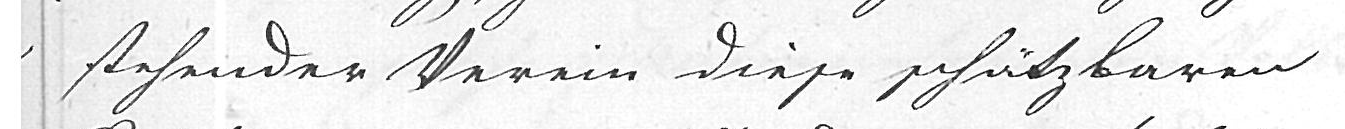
stehender Verein diese schätzbaren
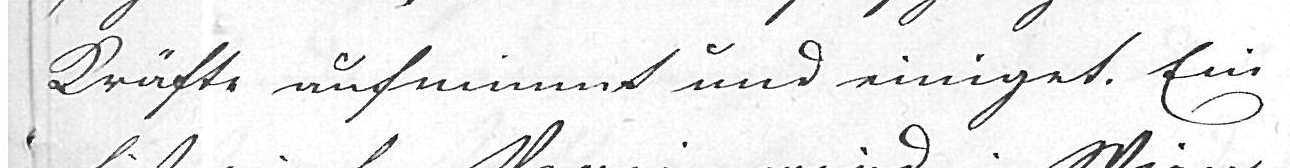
Kräfte aufnimmt und einiget. Ein
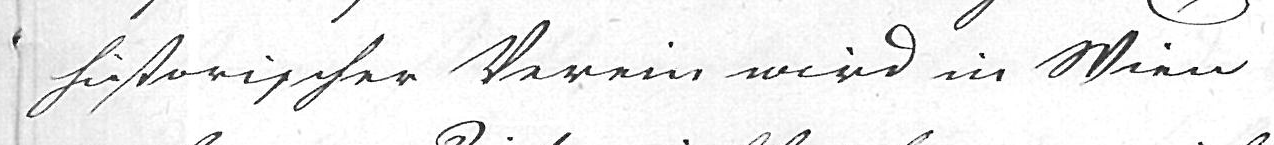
historischen Verein wird in Wien
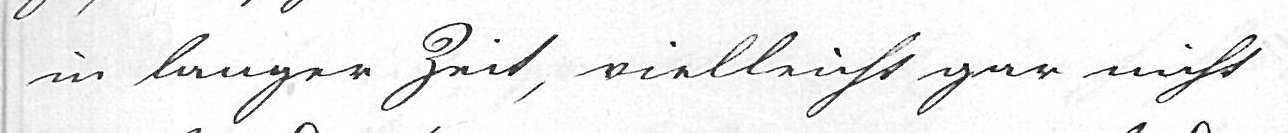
in lange Zeit, vielleicht gar nicht
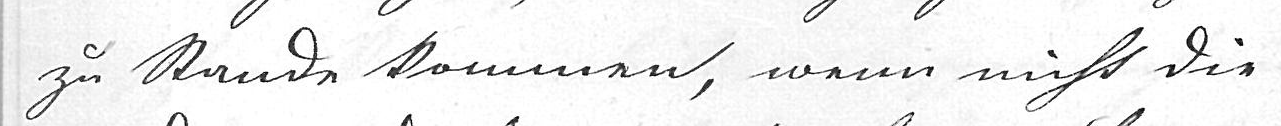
zu Stande kommen, wenn nicht die
